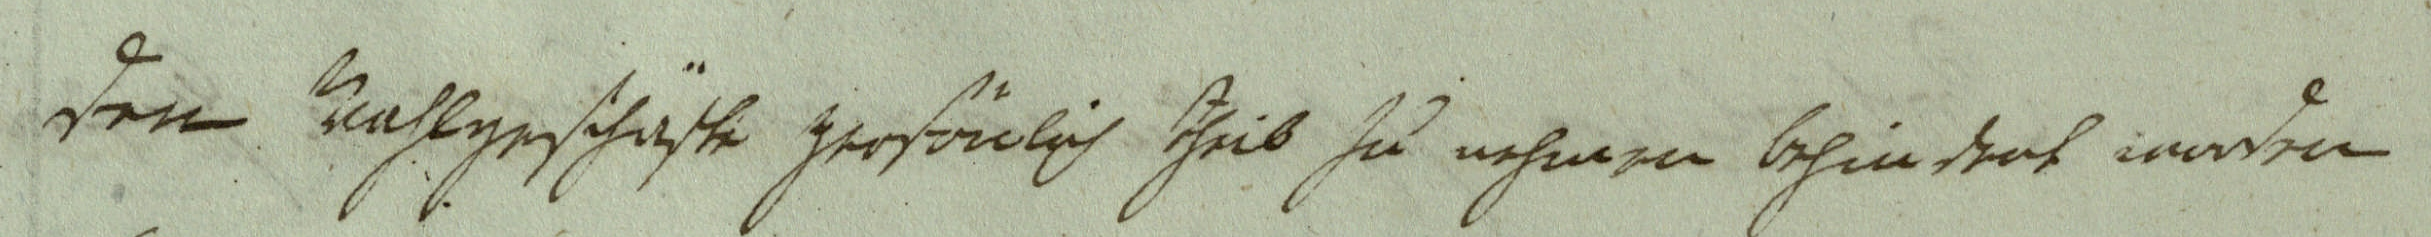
den Wahlgeschäfte persönlich theil zu nehmen behindert worden
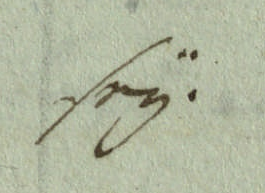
seÿ.
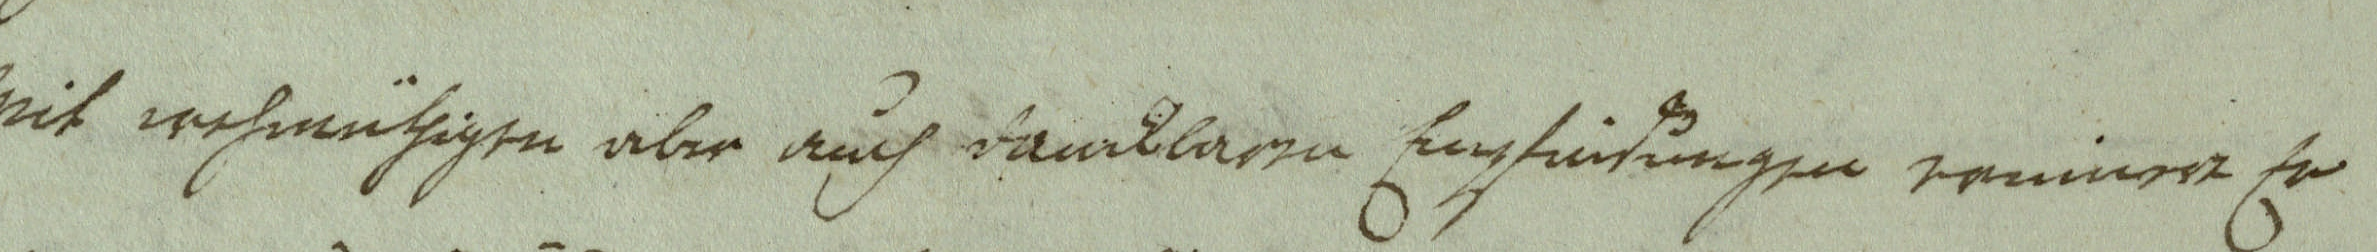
Mit wehmüthigen aber auch danckbaren Empfindungen erinnere Er
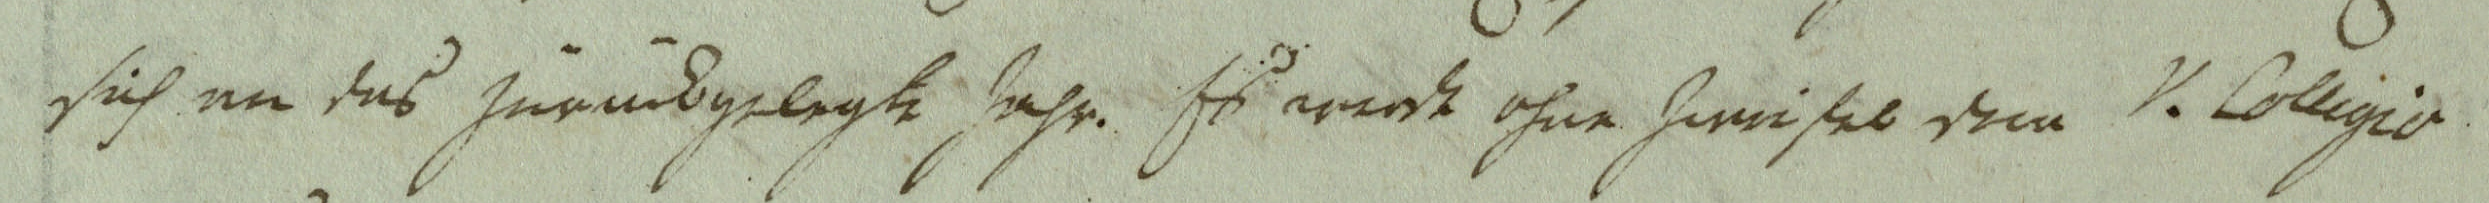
sich an das zurückgelegte Jahr. Es werde ohne Zweifel dem V. Collegio
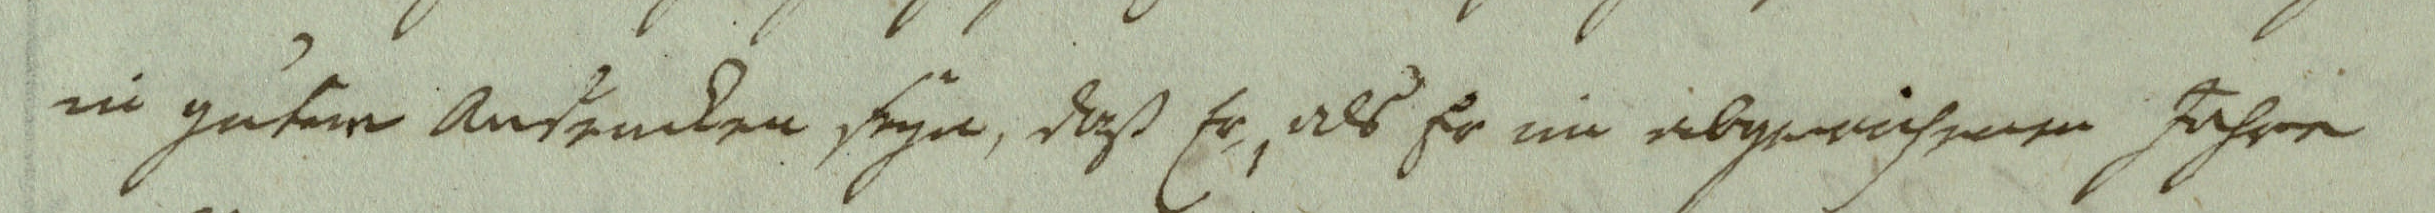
in gutem Andencken seÿn, daß Er, als Er im abgewichenen Jahre
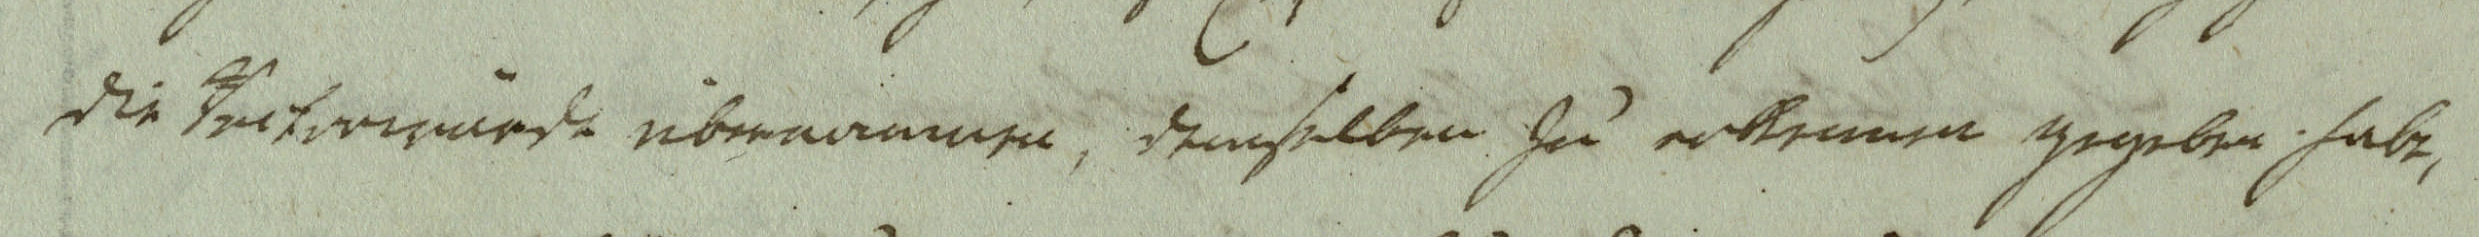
die Rectorwürde übernommen, demselben zu erkennen gegeben habe,
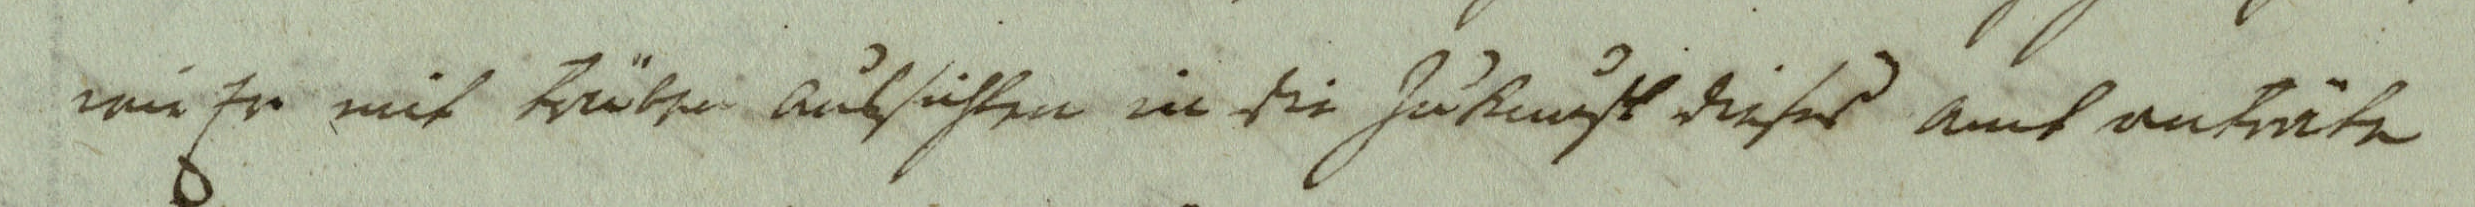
wie Er mit trüben Aussichten in die Zukunft dieses Amt anträte
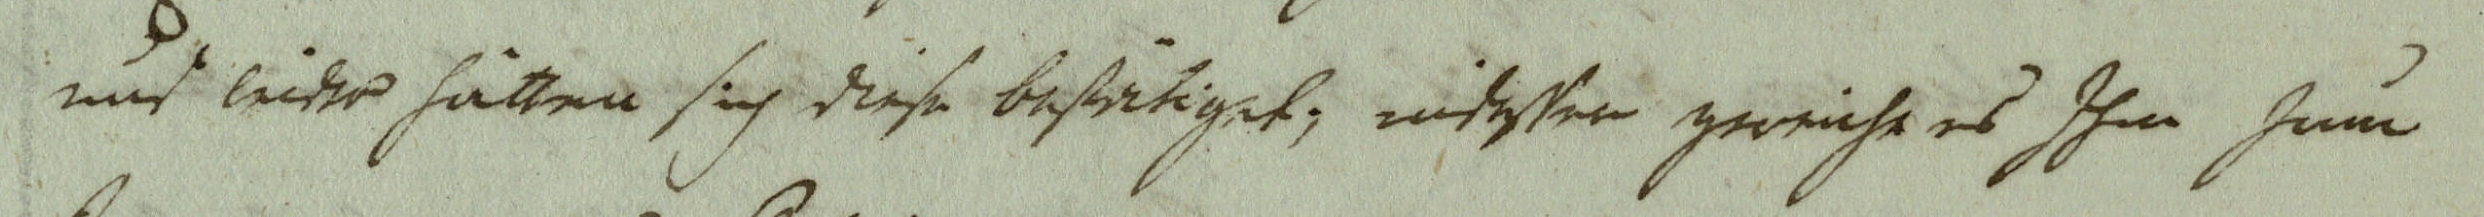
und leider hätten sich diese bestätiget; indessen gereiche es Ihm zum
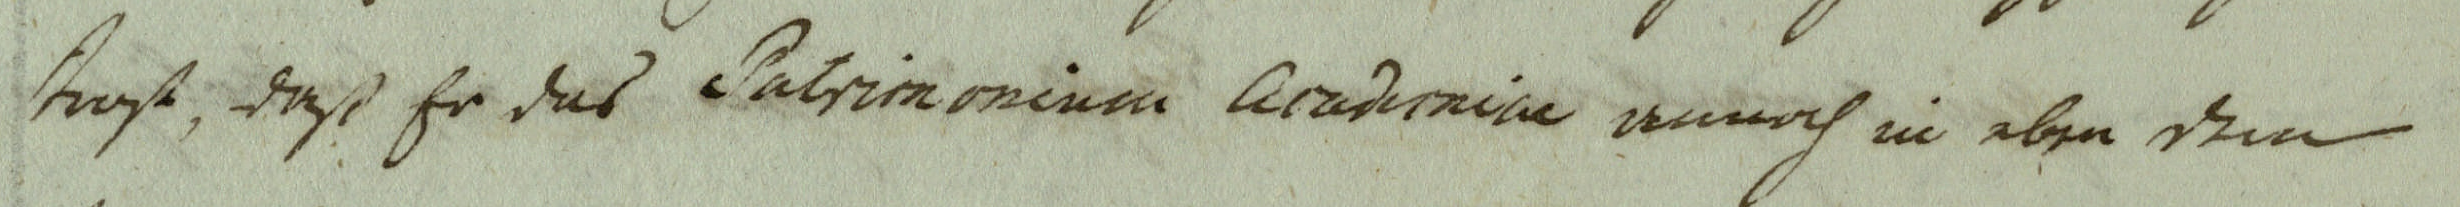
Trost, daß Er das Patrimonium Academiae annoch in eben dem
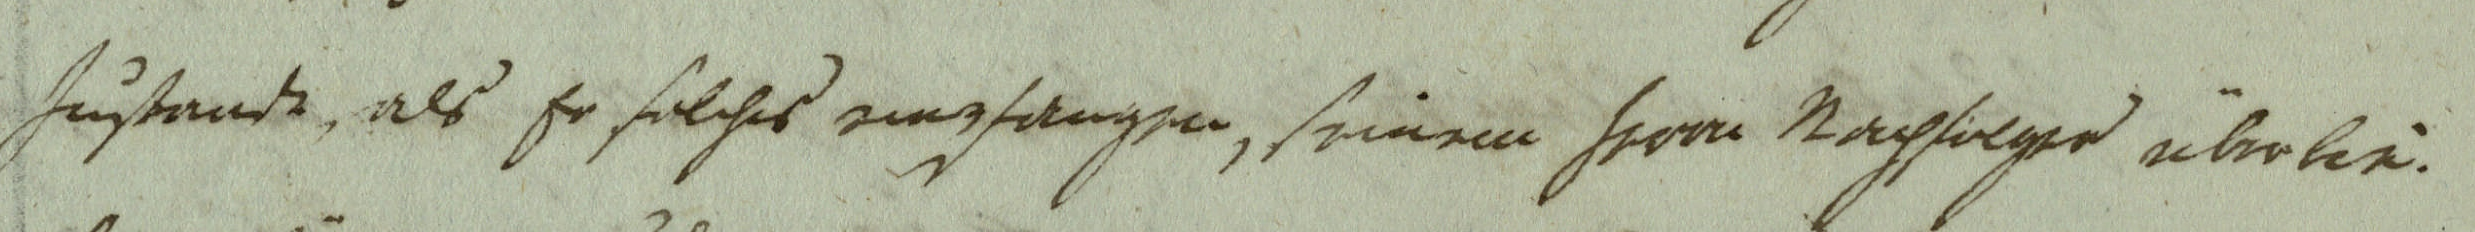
Zustande, als Er solches empfangen, seinem Herrn Nachfolger überlie¬
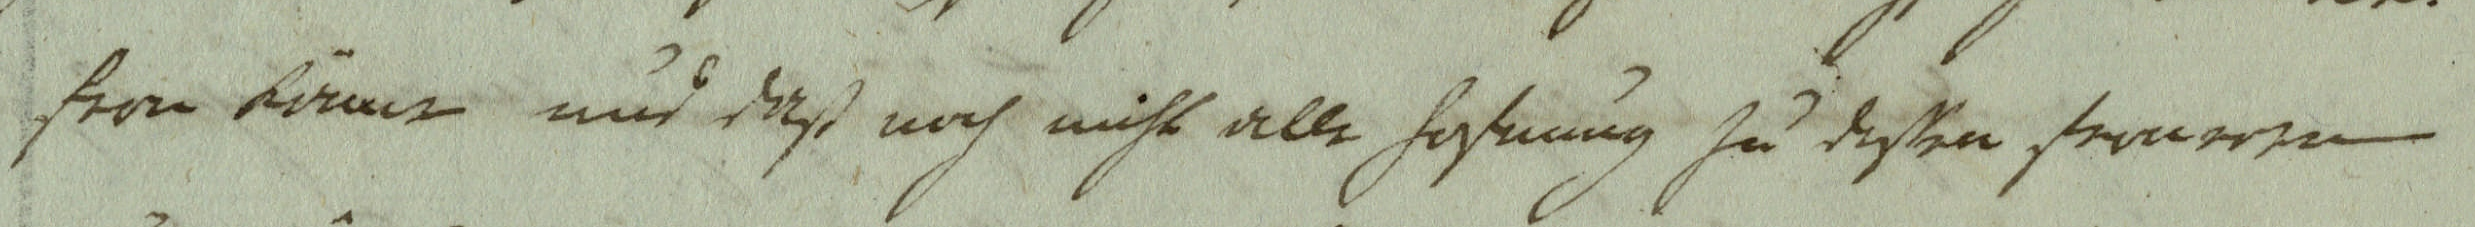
fern könne und daß noch nicht alle Hofnung zu dessen fernerer
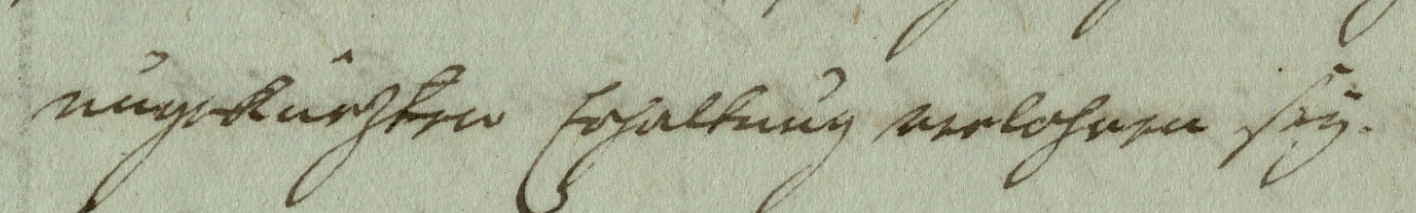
ungekürzten Erhaltung verlohren seÿ.
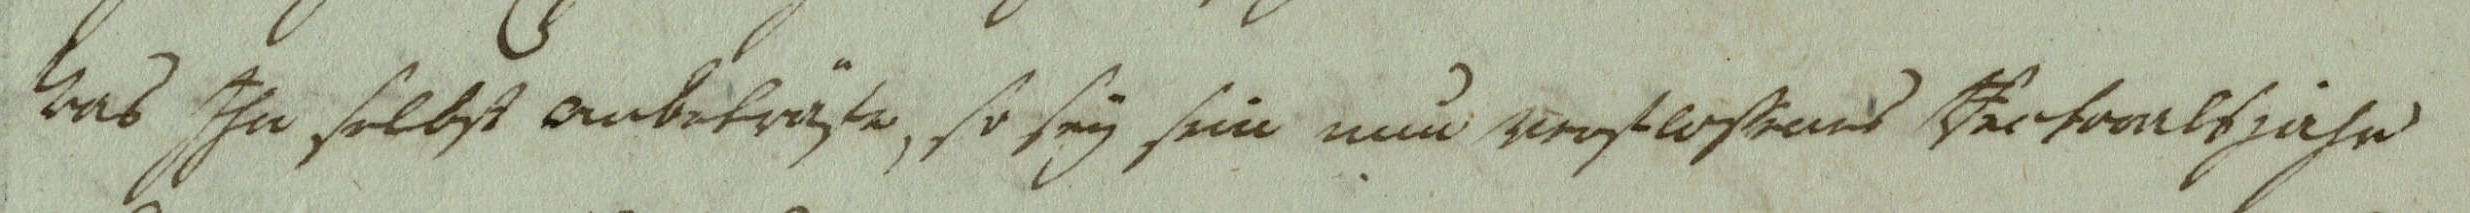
Was Ihn selbst anbeträfe, so seÿ sein nun verflossenes Rectoratsjahr
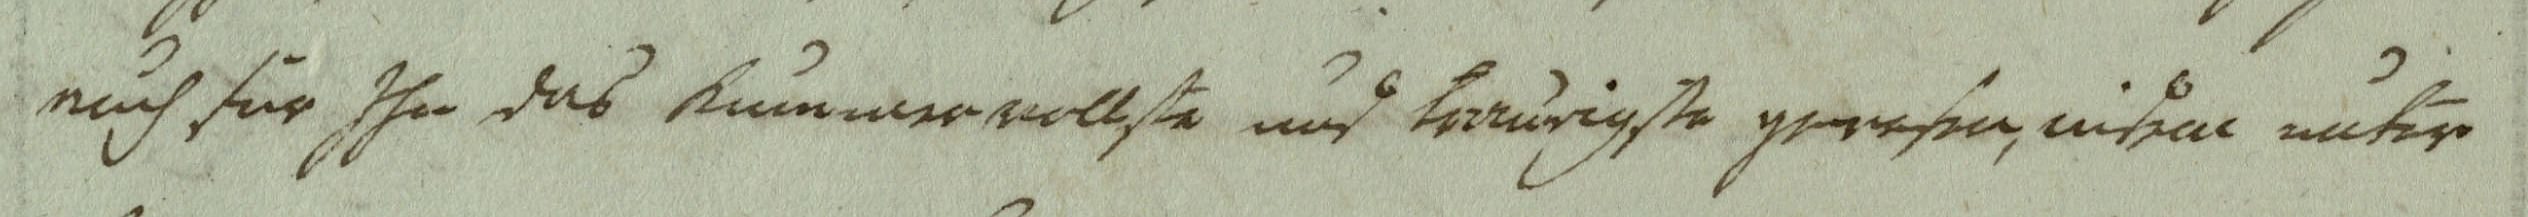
auch für Ihn das kummervollste und traurigste gewesen, indem unter
